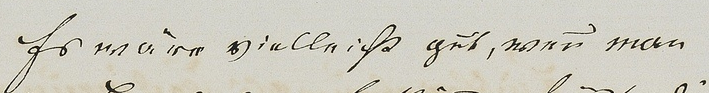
Es wäre vielleicht gut, wenn man
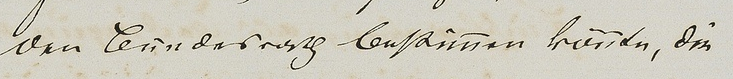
den Bundesrath bestimmen könnte, die
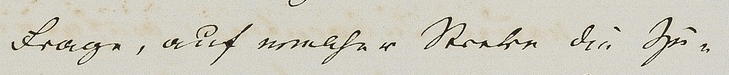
Frage, auf welcher Streke die Zu-
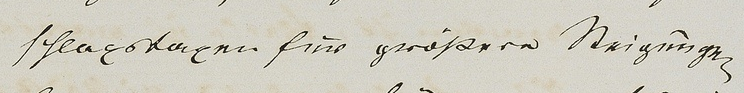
schlagstaxen für größere Steigungen
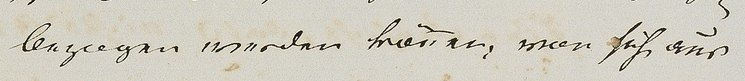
bezogen werden können, von sich aus
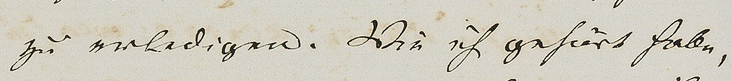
zu erledigen. Wie ich gehört habe,
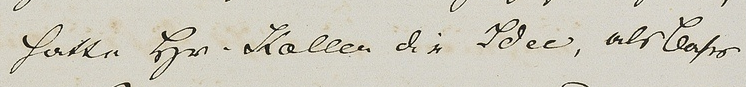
hatte Hr. Koller die Idee, als Basis
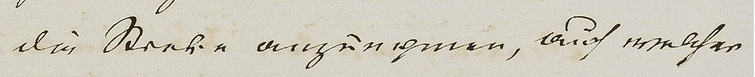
die Streke anzunehmen, auf welcher
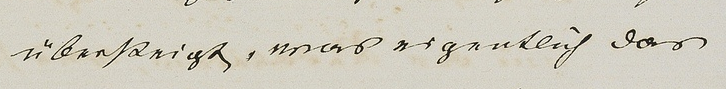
übersteigt, was eigentlich das
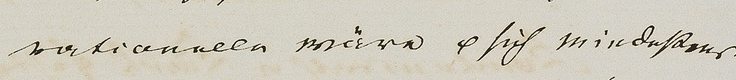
rationelle wäre & sich mindestens
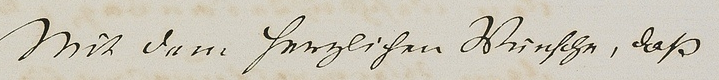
Mit dem herzlichen Wunsche, daß
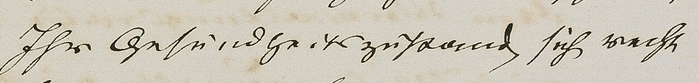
Ihr Gesundheitszustand sich recht
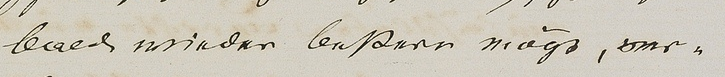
bald wieder beßern möge, ver-
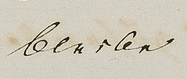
bleibe
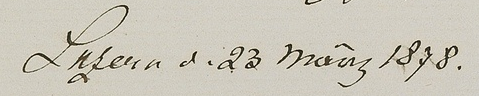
Luzern d. 23 März 1878.
